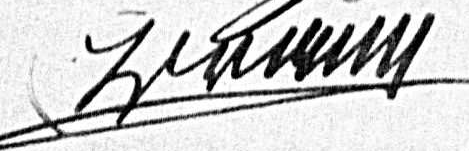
Wannny
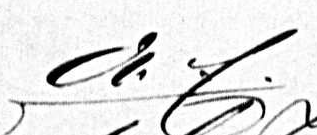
AE
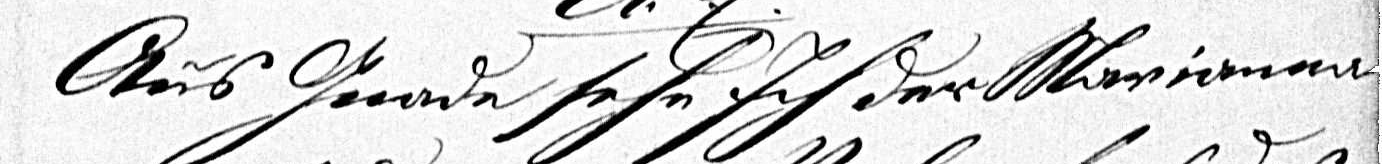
Aus Gnade sehe Ich der Marianna
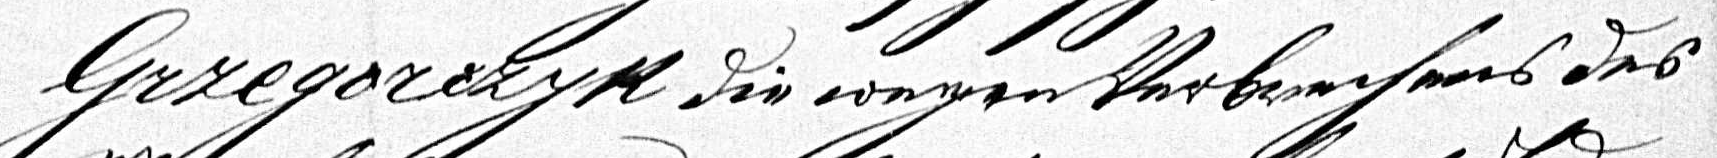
Grzegorczyk die wegen Verbrechens des
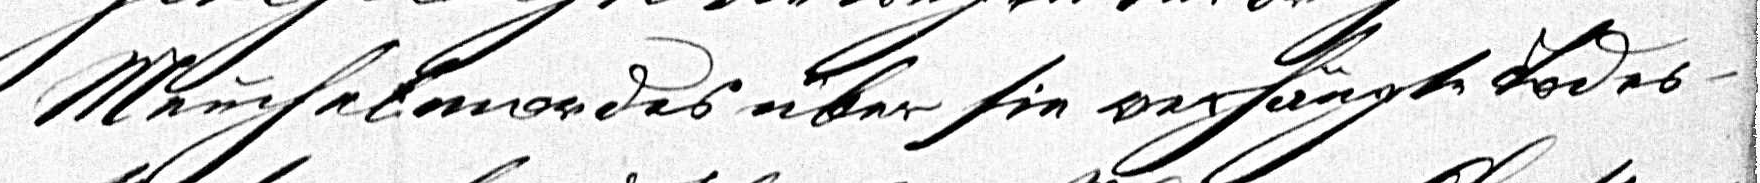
Meuchelmordes über sie verhängte Todes¬
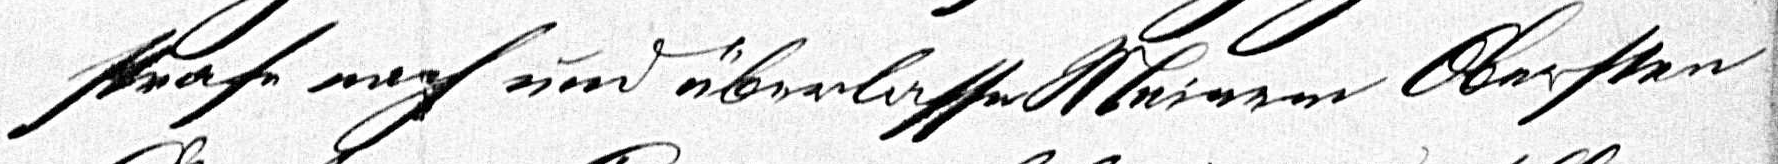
strafe nach und überlasse Meinem Obersten
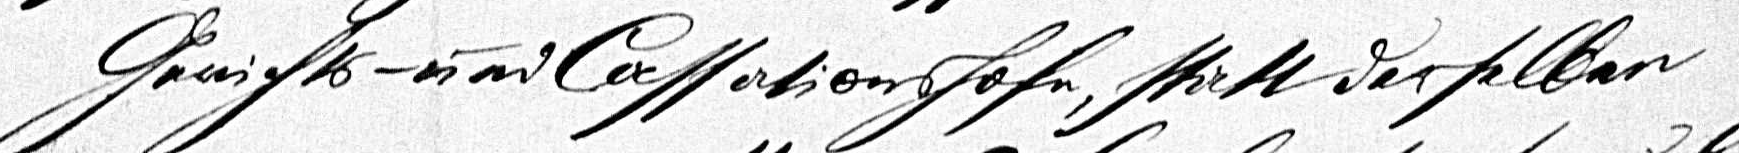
Gerichts- und Cassationshofe, statt derselben
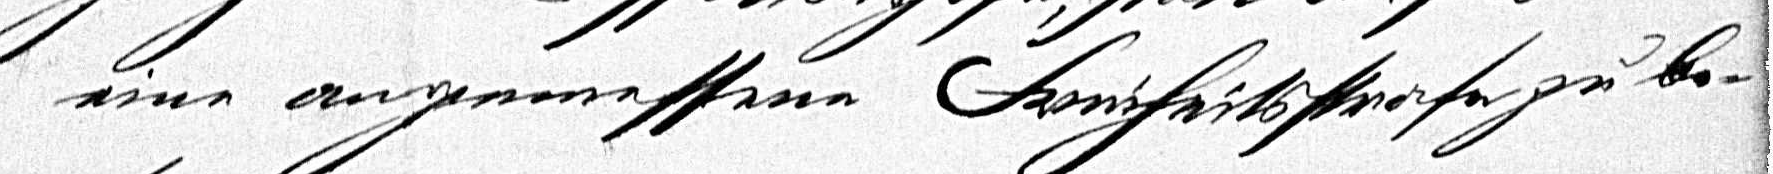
eine angemessene Freiheitsstrafe zu be¬
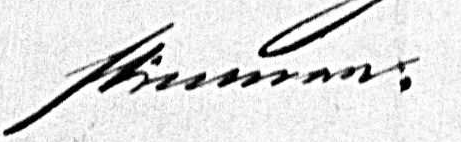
stimmen.
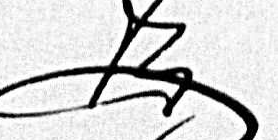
FJ
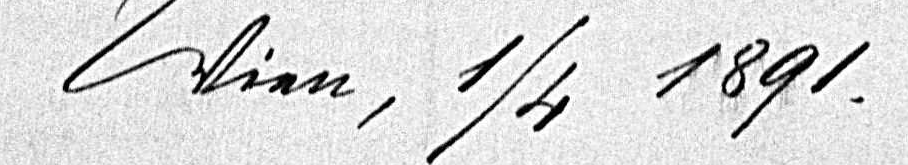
Wien, 1/4 1891
